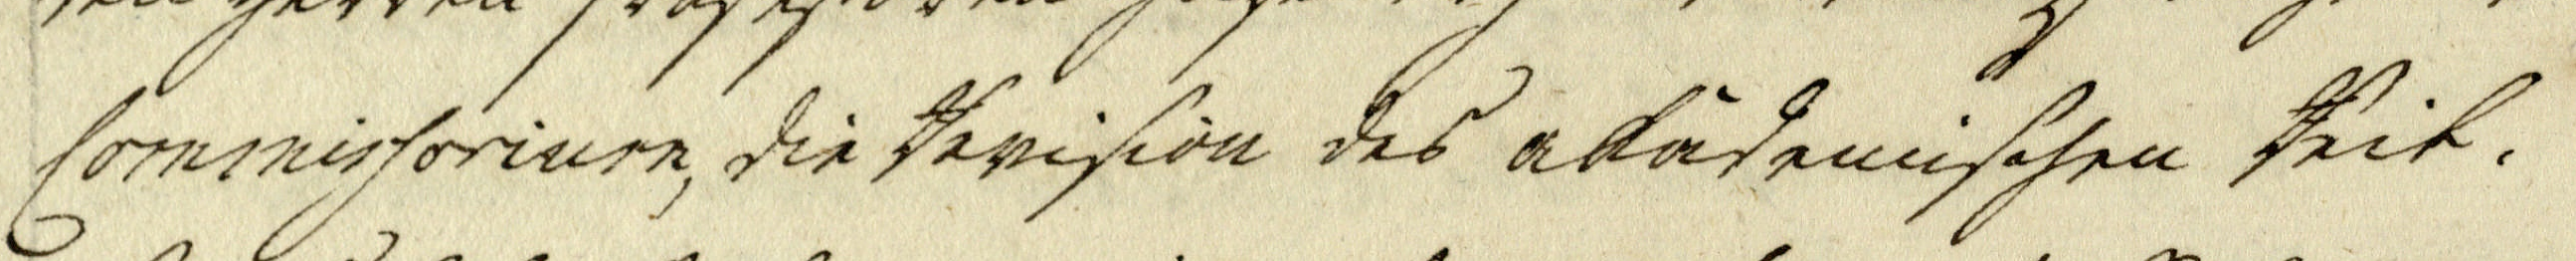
Commissorium, die Revision des akademischen Reit¬
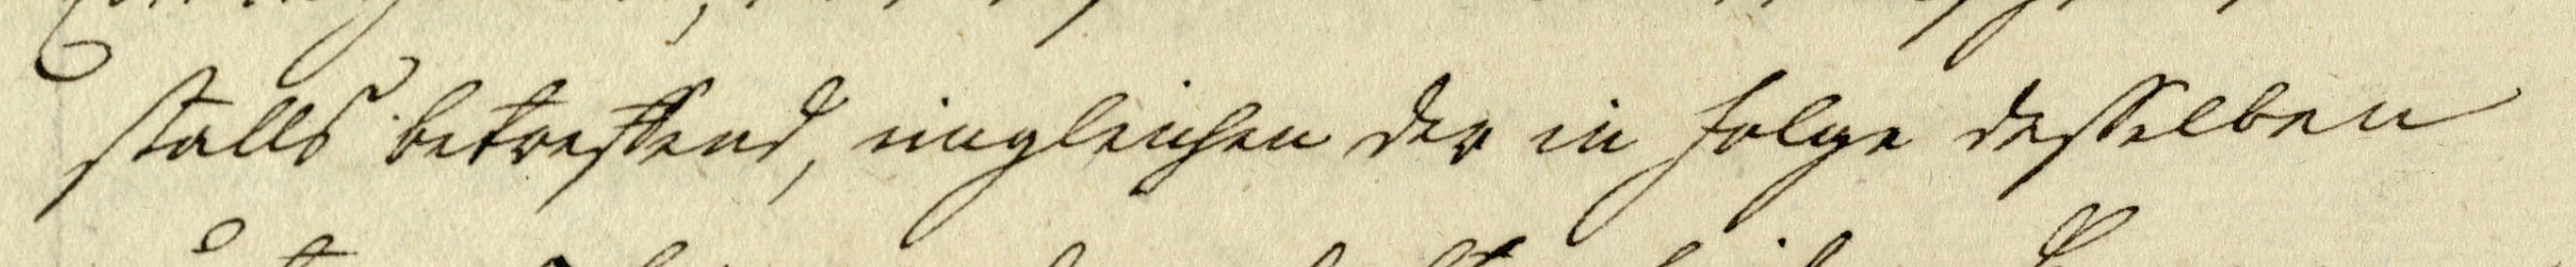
stalls betreffend, imgleichen der in Folge desselben
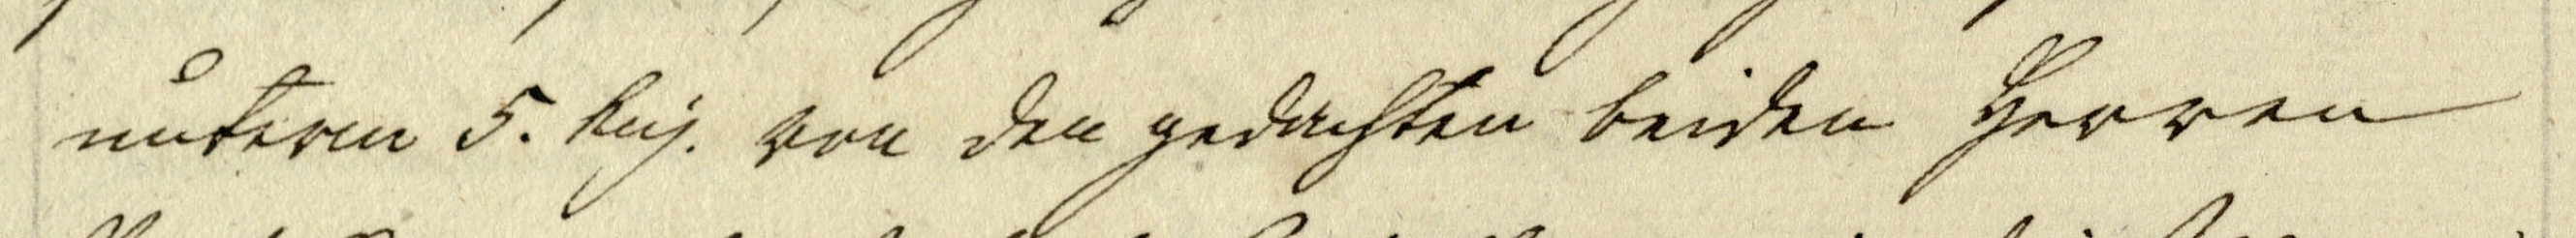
unterm 5. huj. von den gedachten beiden Herren
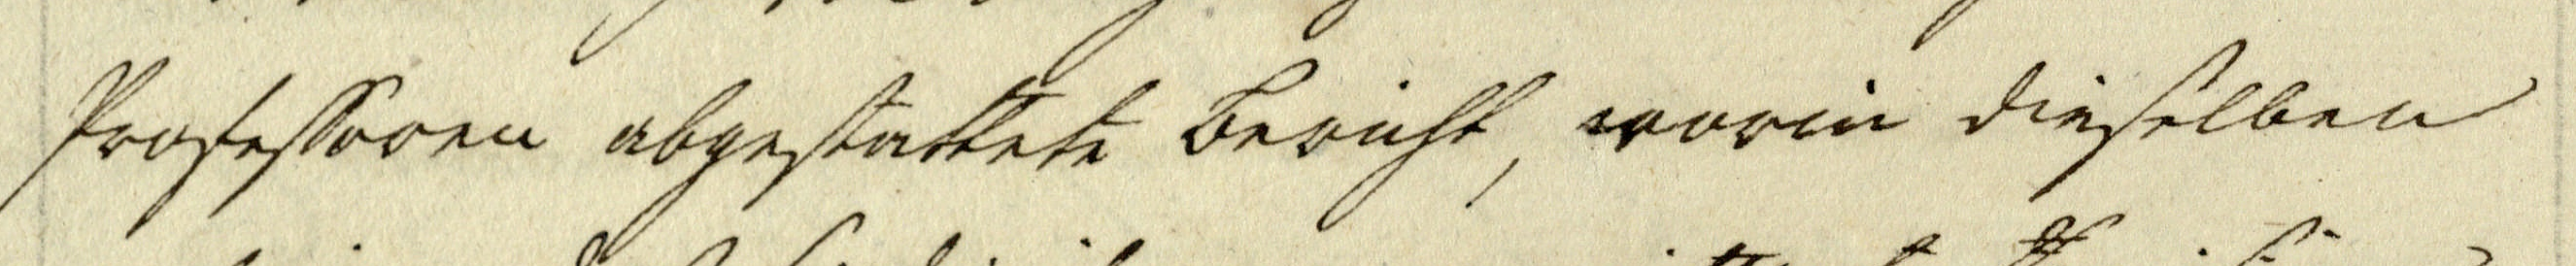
Professoren abgestattete Bericht, worin dieselben
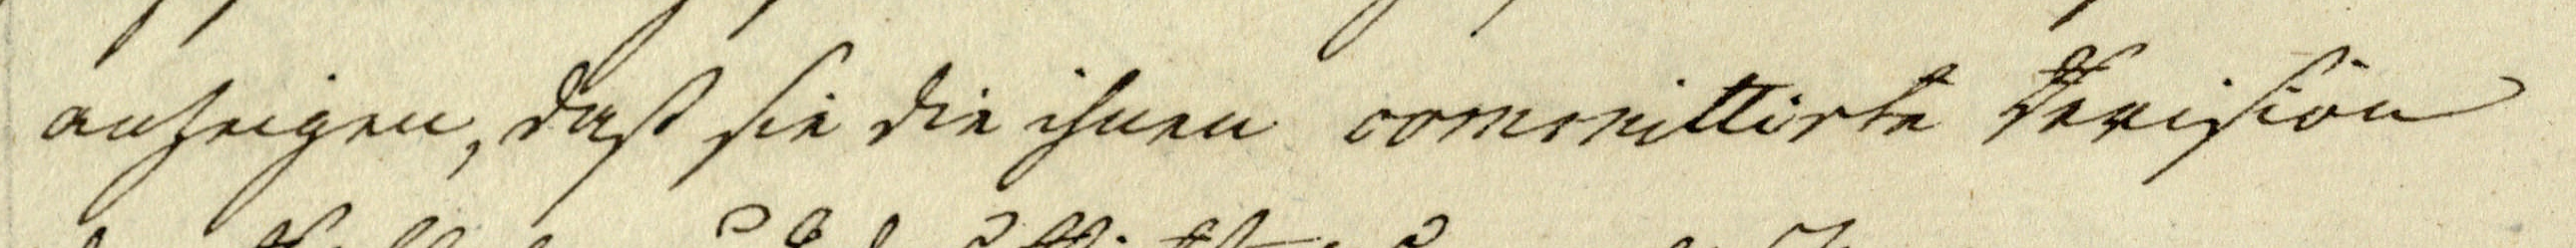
anzeigen, daß sie die ihnen committirte Revision
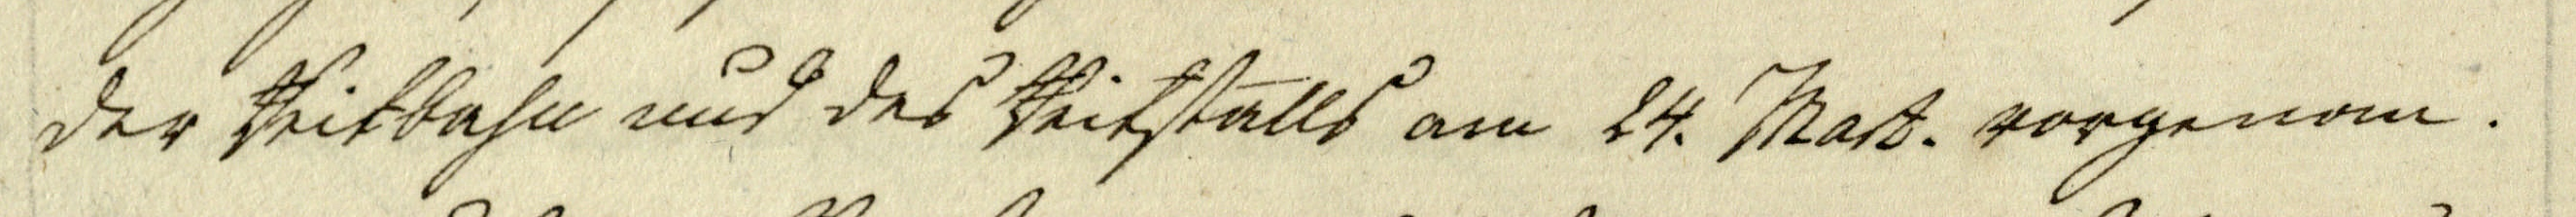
der Reitbahn und des Reitstalls am 24. Mart. vorgenom¬
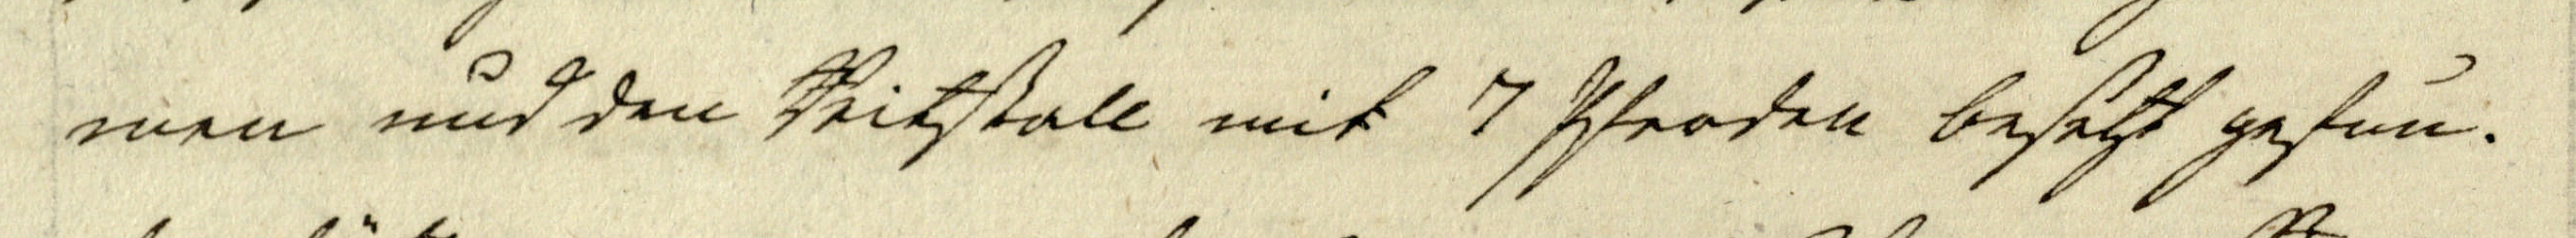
men und den Reitstall mit 7 Pferden besetzt gefun¬
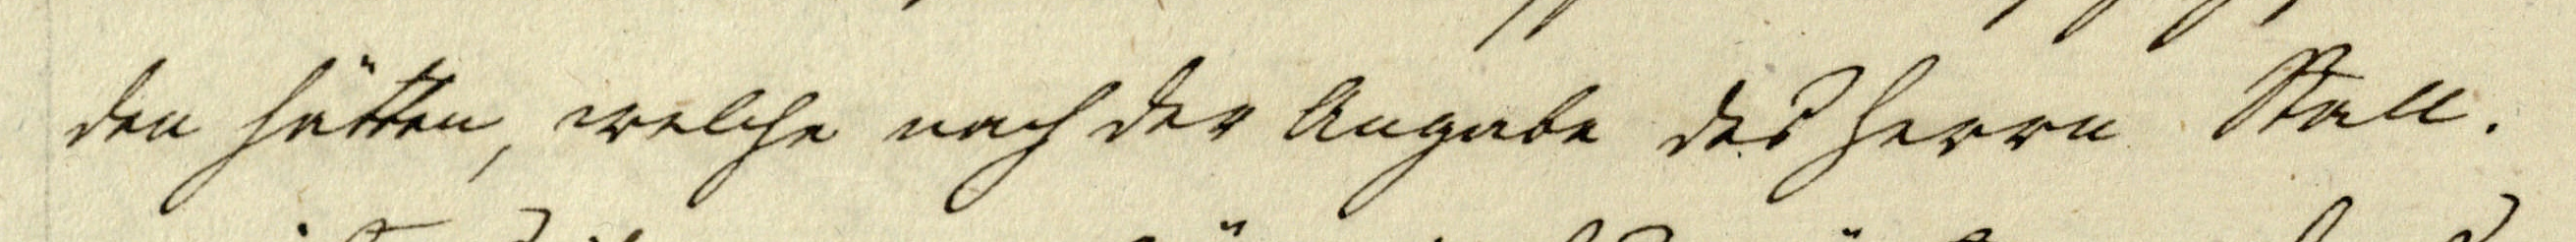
den hätten, welche nach der Angabe des Herrn Stall¬
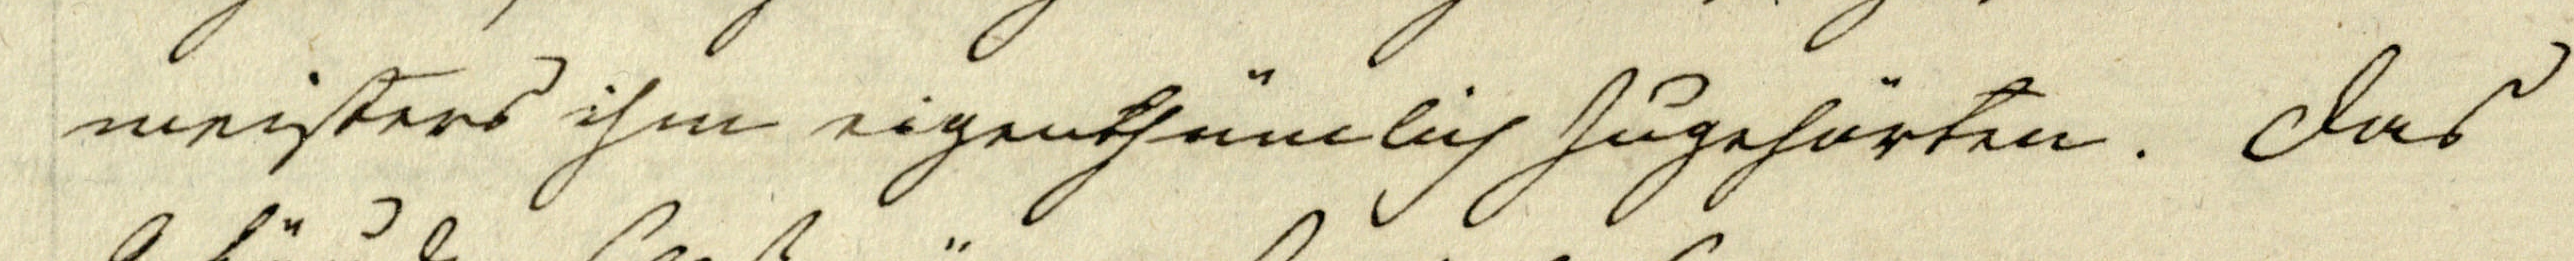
meisters ihm eigenthümlich zugehörten. Das
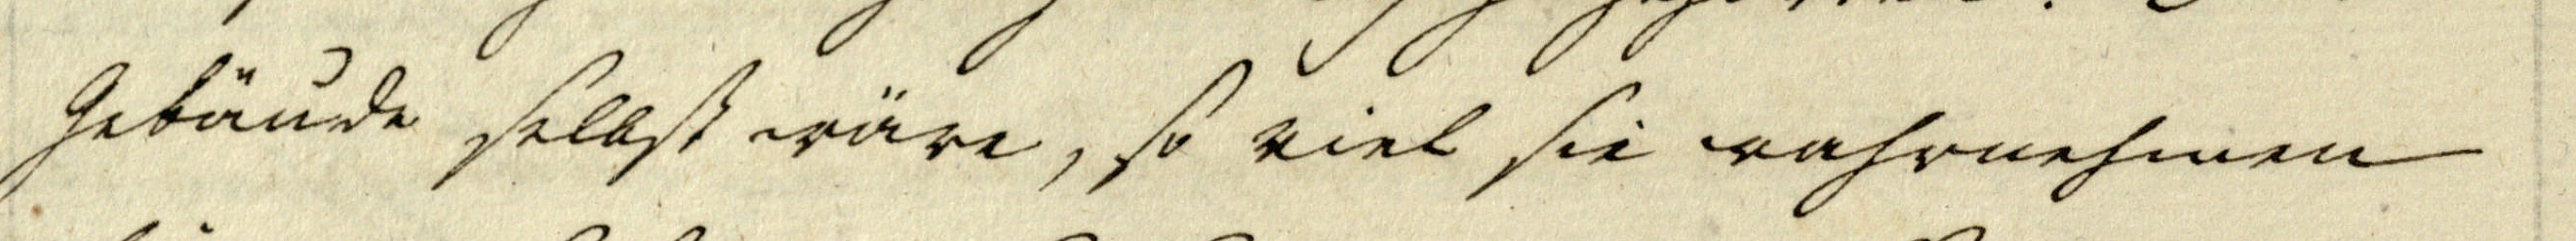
Gebäude selbst wäre, so viel sie wahrnehmen
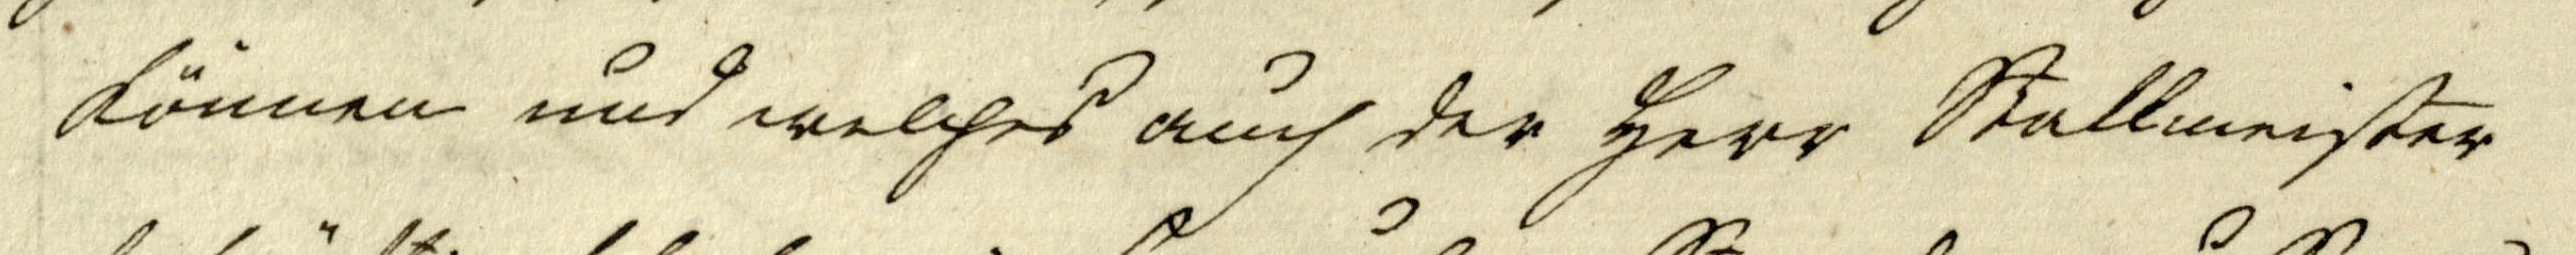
können und welches auch der Herr Stallmeister
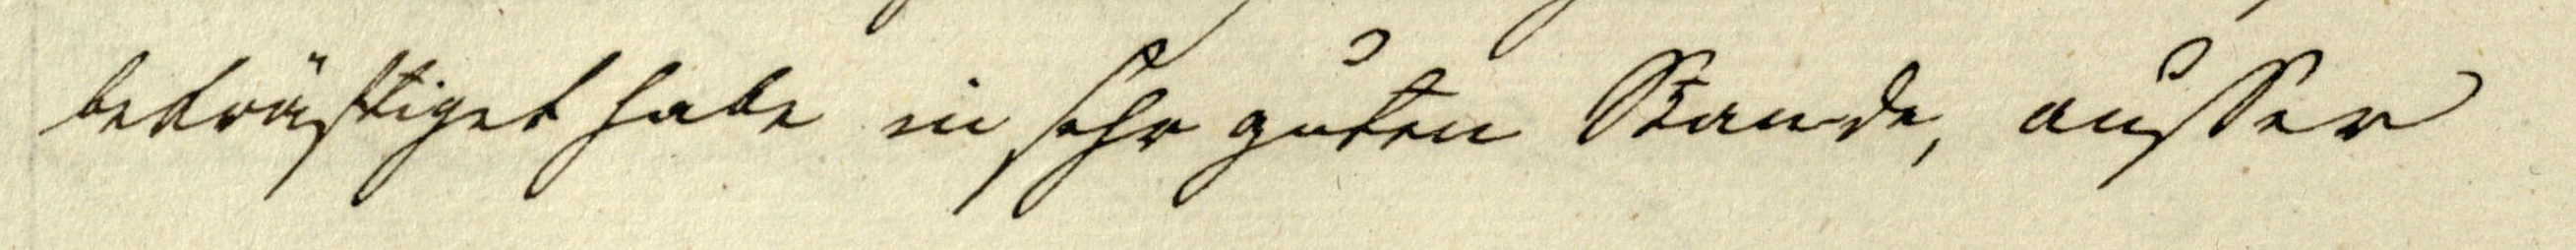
bekräfiget habe in sehr guten Stande, ausser
